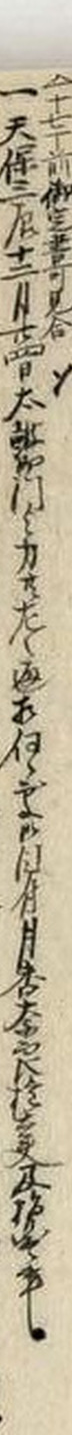一天保三辰十二月廿四日太鼓御門与力左之通相伺候処御目付月番奈良権太夫及指図候事
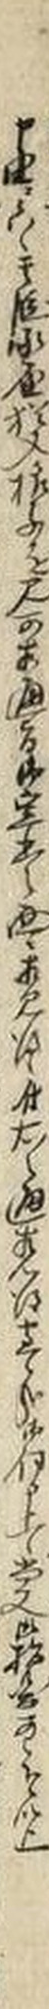申儀に候ハヽ其段承届猶又様子を見可相通旨御定書之面々ニ相見得候に付右之通相心得置候哉御伺申上候尚又御指図可被下候以上
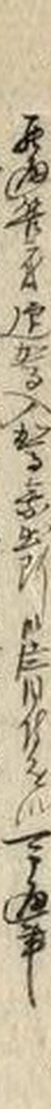罷通候筈に付迎駕入駕乗出断御徒目付を以可申通事
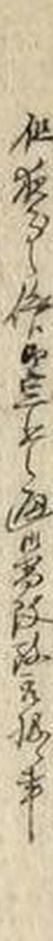但夜分の儀は御定書之通御番改致取扱候事

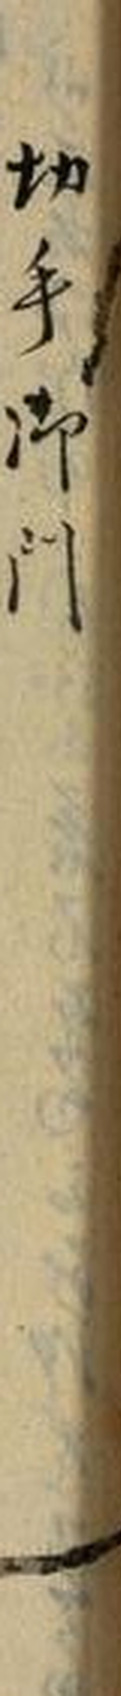切手御門
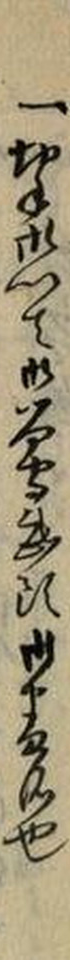一切手御門は御留守武頭御番所也
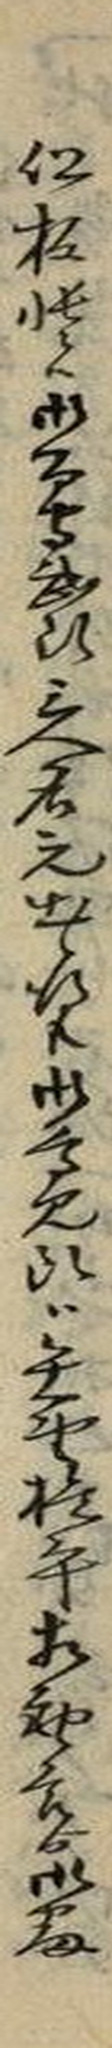但板帳には御留守武頭三人名元出候得共御馬見頭は矢野権平相勤候節ゟ御番
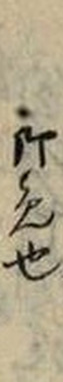御免也
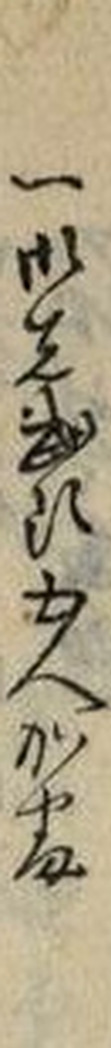一御先武頭五人加番
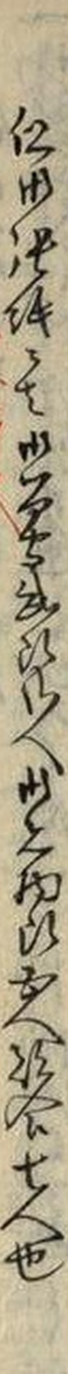但御張紙には御留守武頭弐人御先物頭五人都合七人也
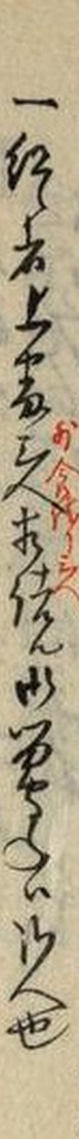一組之者上番三人相詰ル御留守年は弐人也
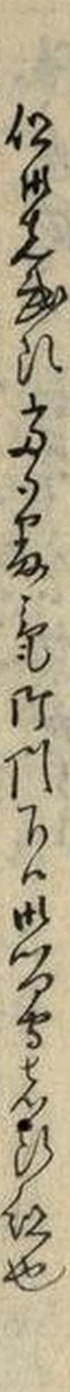但御先武頭当御番に而も御門下は御留守者頭也
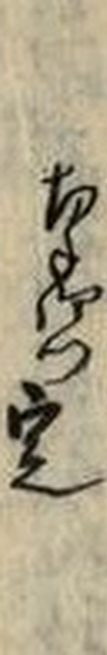切手御門定
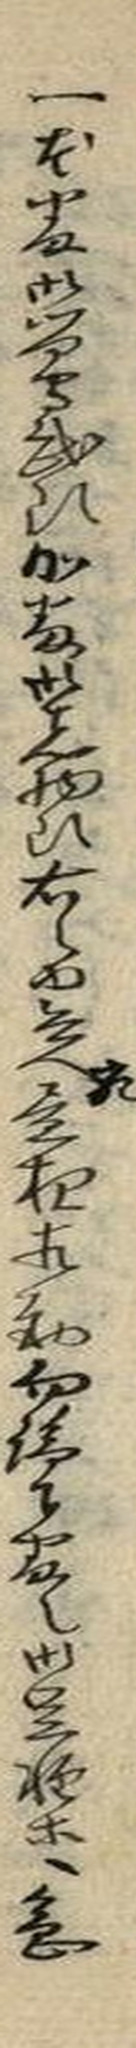一本番御留守武頭加番御先物頭右之内壱人宛昼夜相勤勿論下番之御足軽等へ急
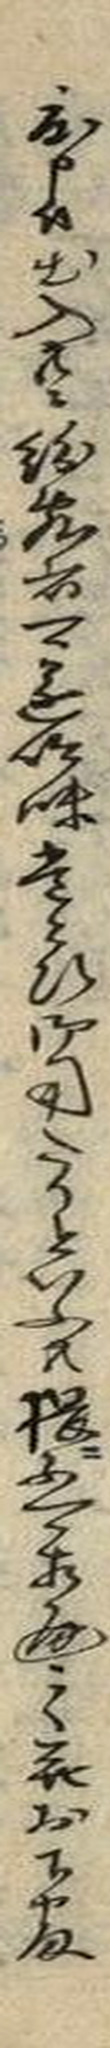度申付出入共に紛敷者可遂吟味たとひ御用たりといふ共猥に不可相通に候并於下番
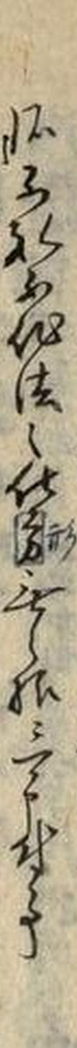所不礼不作法之仕形無之様に可申付候事
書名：御門御櫓之部
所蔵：福井県文書館 Fukui Prefectural Archives
